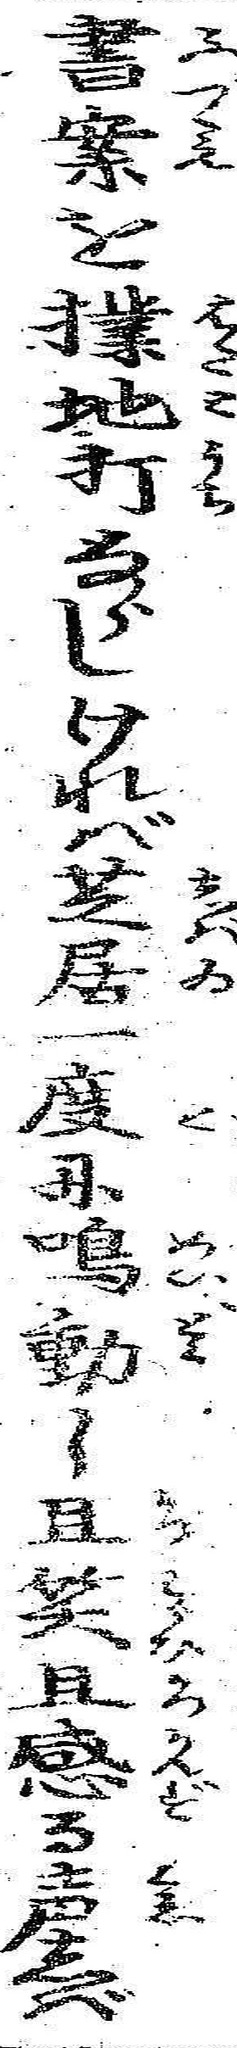書案を撲地打ならしければ芝居一度に鳴動し且笑且感る声しば
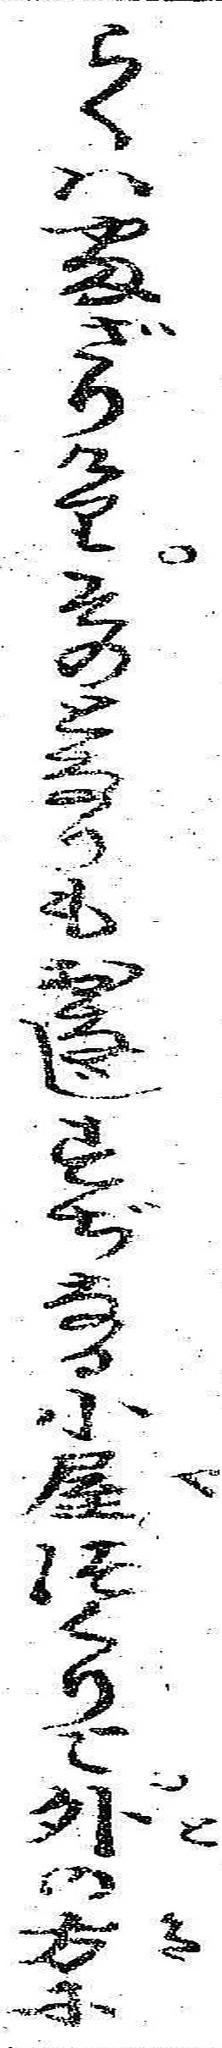らくはやまざりけり。そのとなりもおなじすぢなる小屋つくりて。外の方に
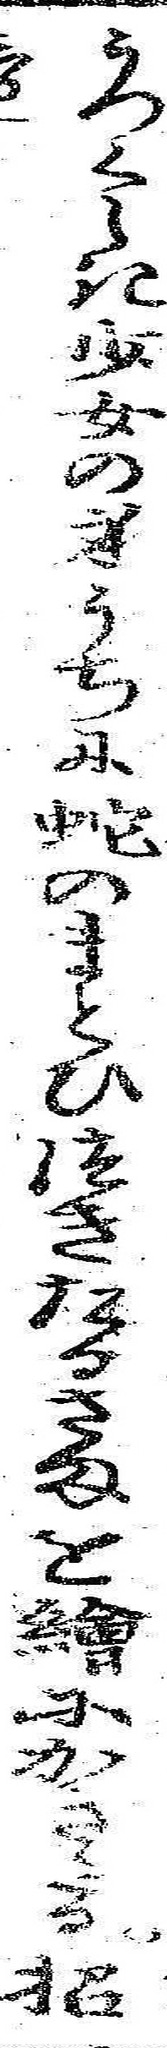うつくしき少女の身うちに蛇のまとひつきたるさまを絵にかきたる。招
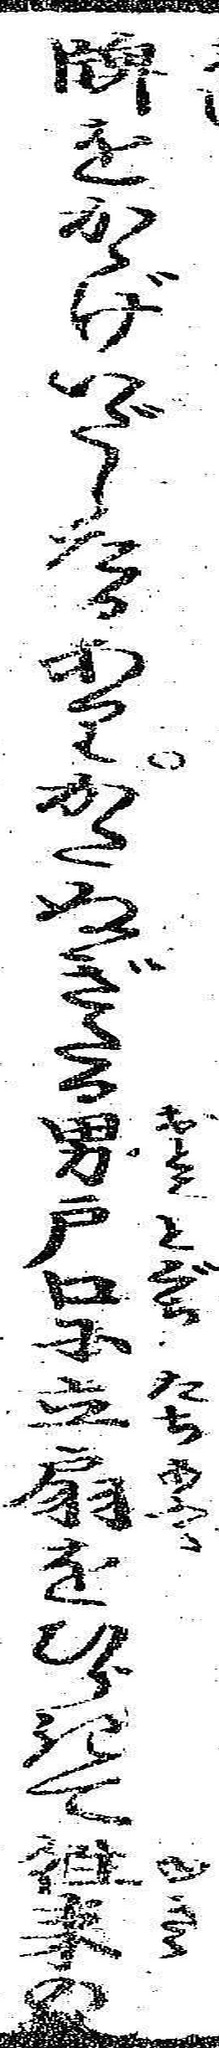牌をかゝげいだしたるあり。かたぬぎたる男戸口に立扇をひらきて往来の
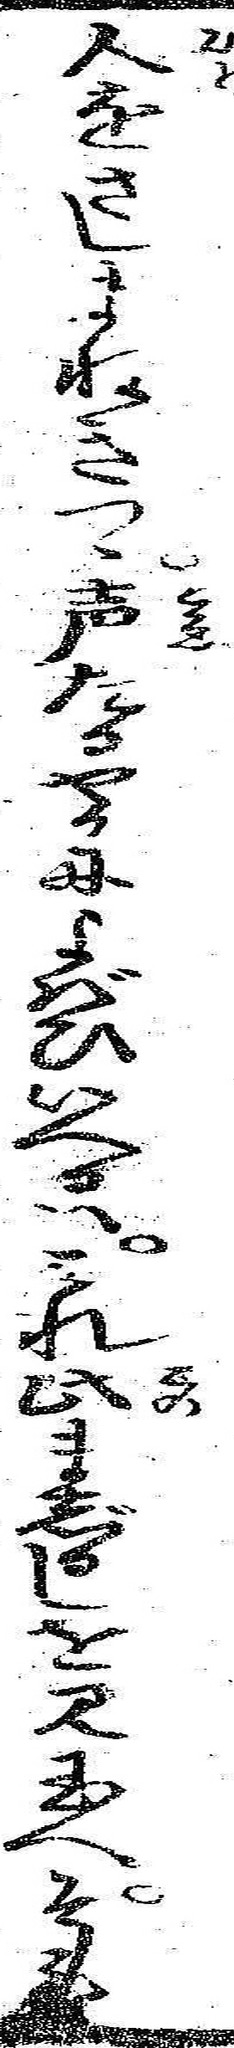人をさしまねきつゝ。声たかやかによばひいへるは。これ此まじるしを見玉へ。そも
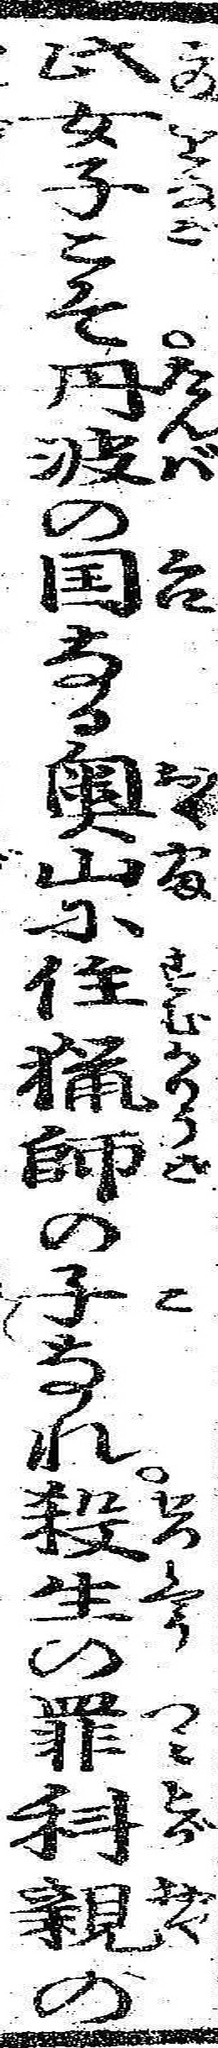此女子こそ。丹波の国なる奥山に住猟師の子なれ。殺生の罪科親の
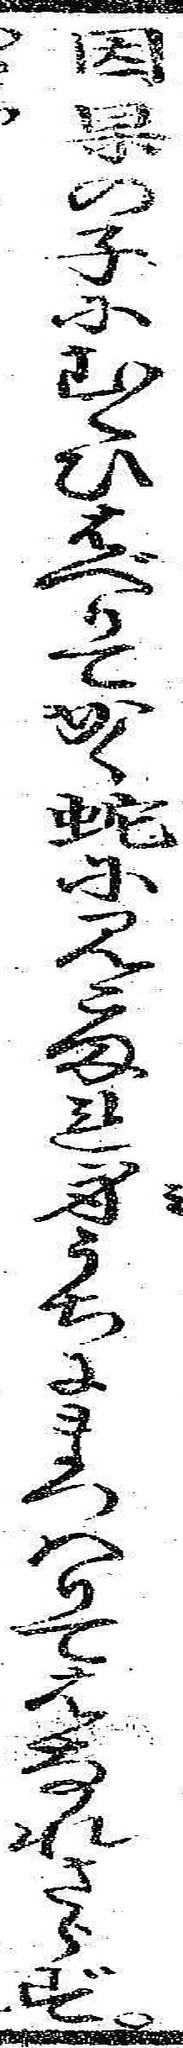因果の子にむくひはべりてかく蛇に見こまれ身うちにまつはりてはなれさらず。
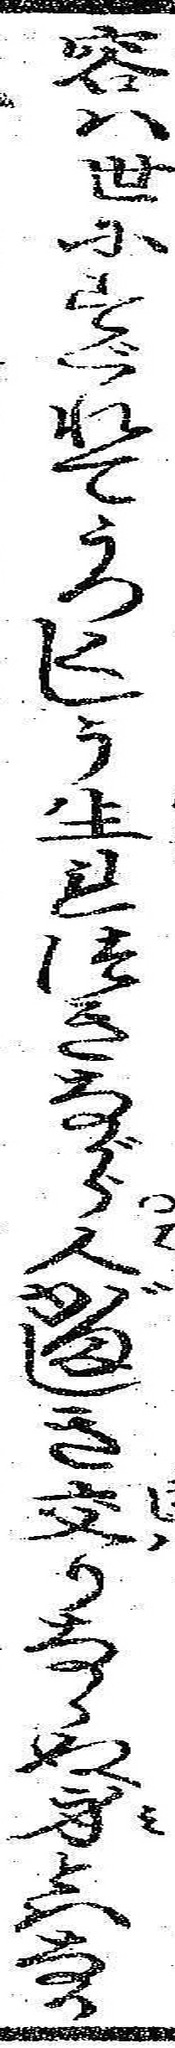容は世にすぐれてうつくしう生れつきながら。人がましき交りならぬ身とはなり
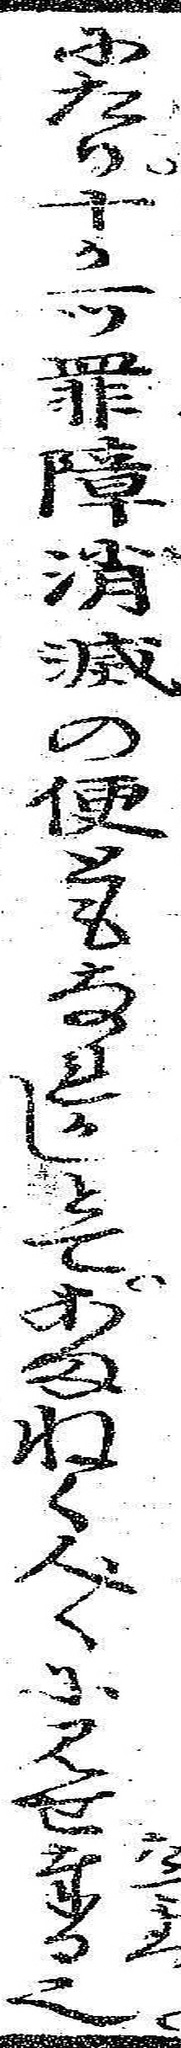にたり。十か一ツ罪障消滅の便ともなれかしとて。あまねく人々に見せ奉る也。
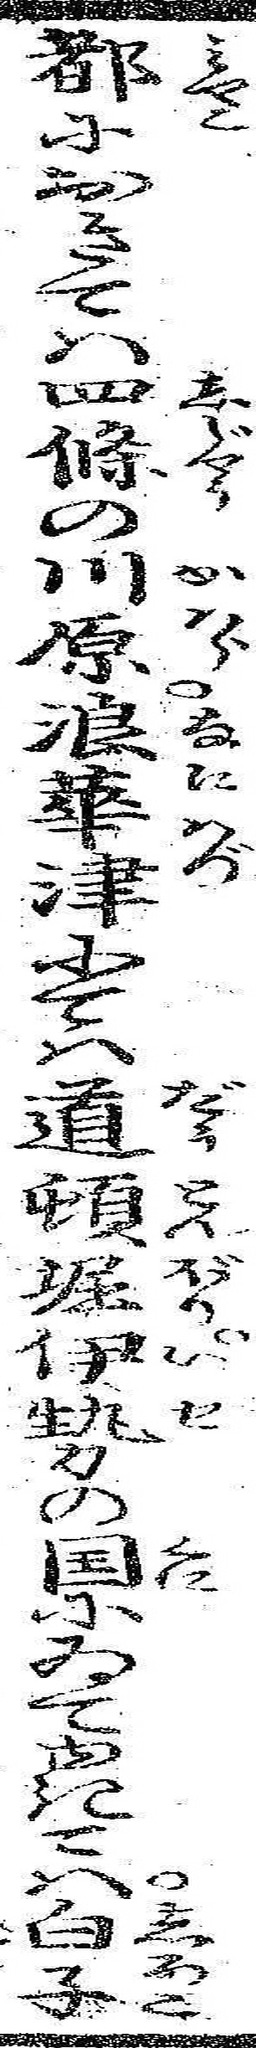都におきては四条の川原。浪華津にては道頓堀。伊勢の国にゐてゆきては。白子
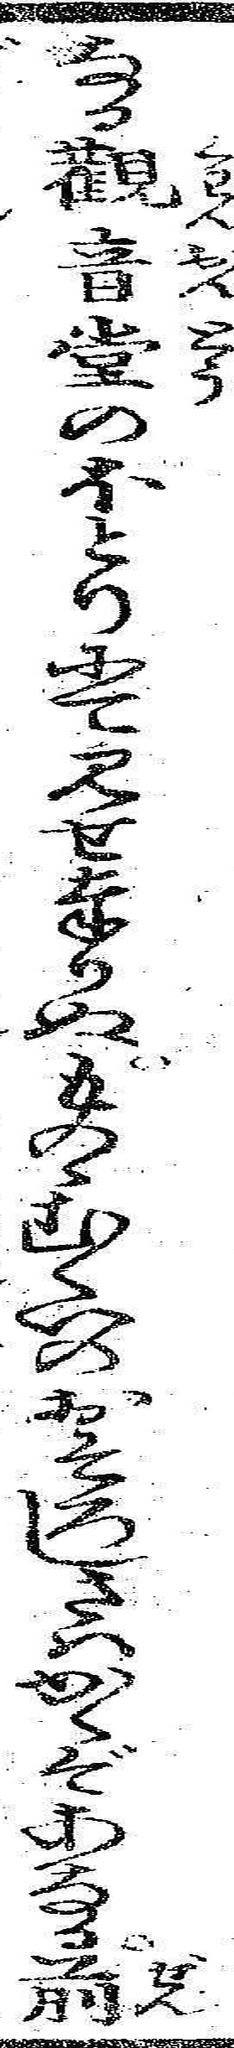なる観音堂のほとりにて見せ奉りぬ。ものゝむくいのおそろしさはかくぞあなる。前
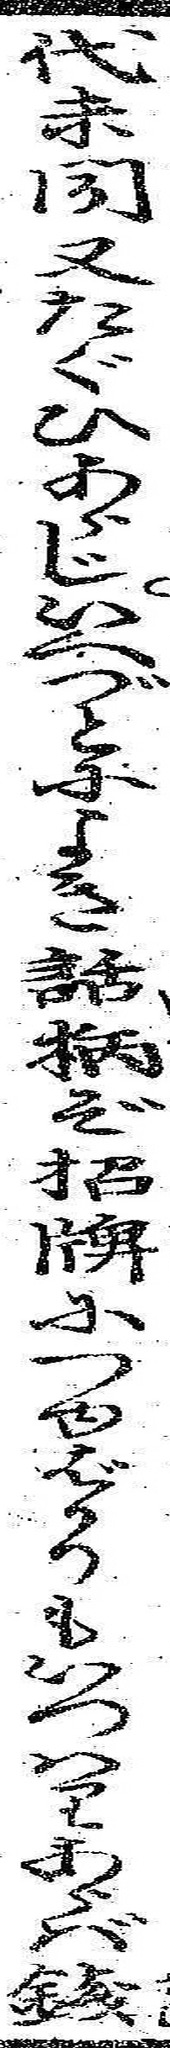代未聞又たぐひあらじ。いへづとによき話柄ぞ招牌につゆばかりもいつはりあらば銭
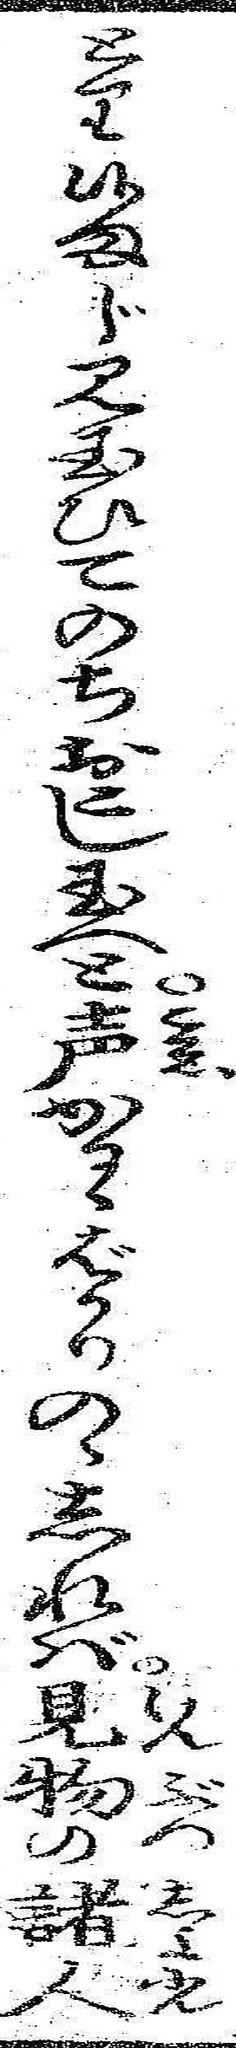とり候まじ見玉ひてのちおこし玉へと。声かるゝばかりのゝしれば。見物の諸人
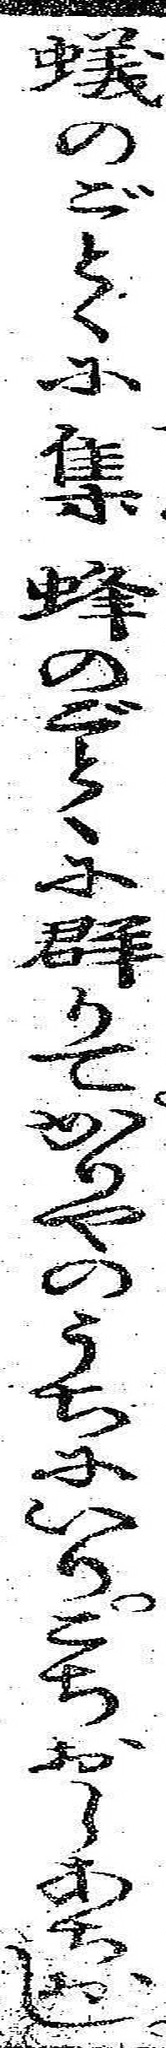蟻のごとくに集蜂のごとくに群りて。かりやのうちにいり。こちおしあちおし。
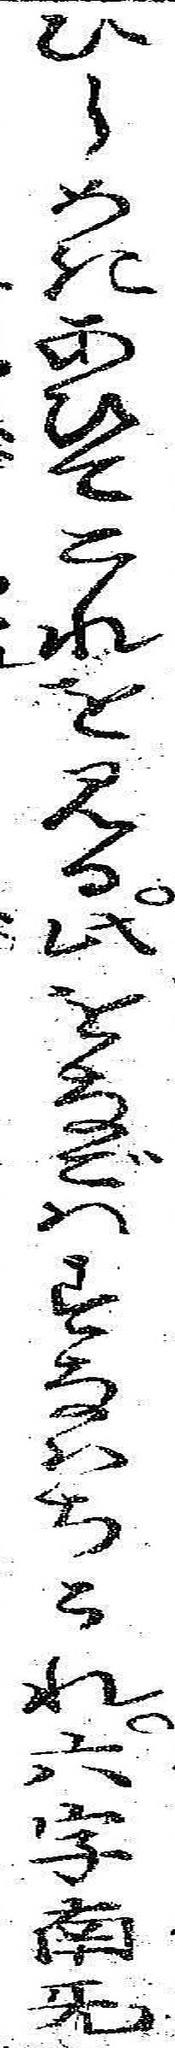ひしめきあひてこれを見る。此をなごはすなはちこれ。六字南無
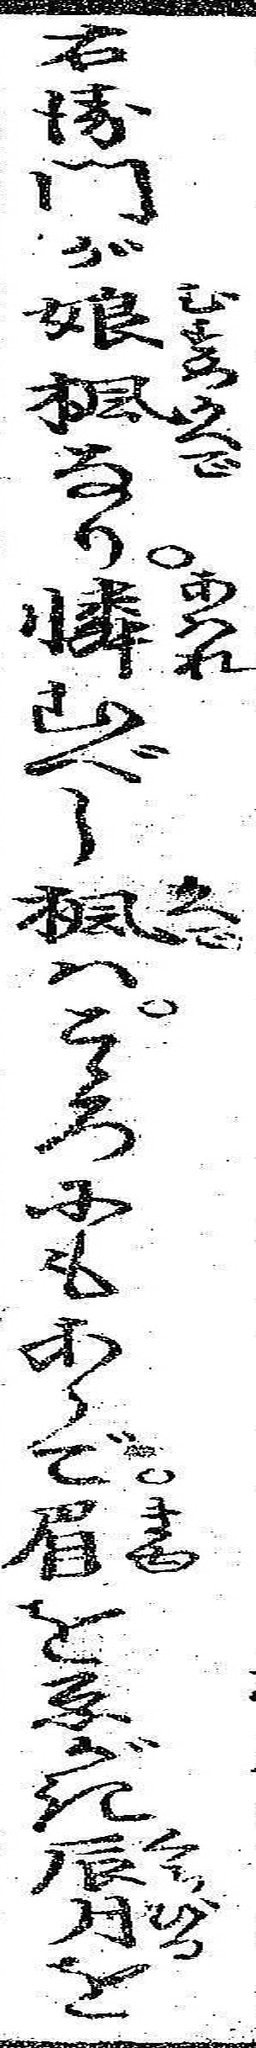右衛門が娘楓なり。憐むべし楓は。こゝろにもあらで。眉をゑがき脣を
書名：昔話稲妻表紙
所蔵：国文学研究資料館
